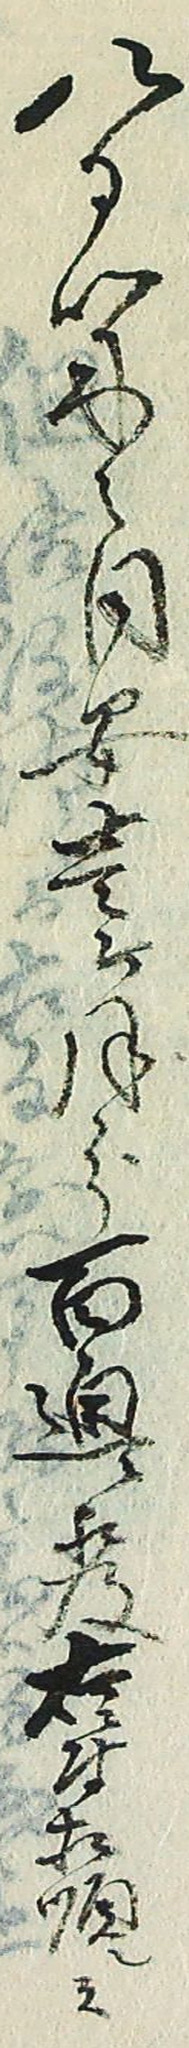八月以来之目安壱ケ月分百通ニ相及右ニ付相順シ候
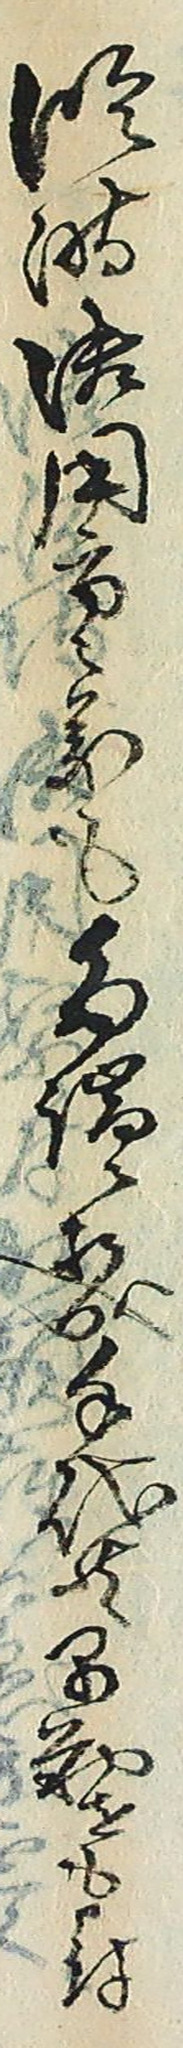臨時御用方之義も多端ニ相成手代共早勤をも申付
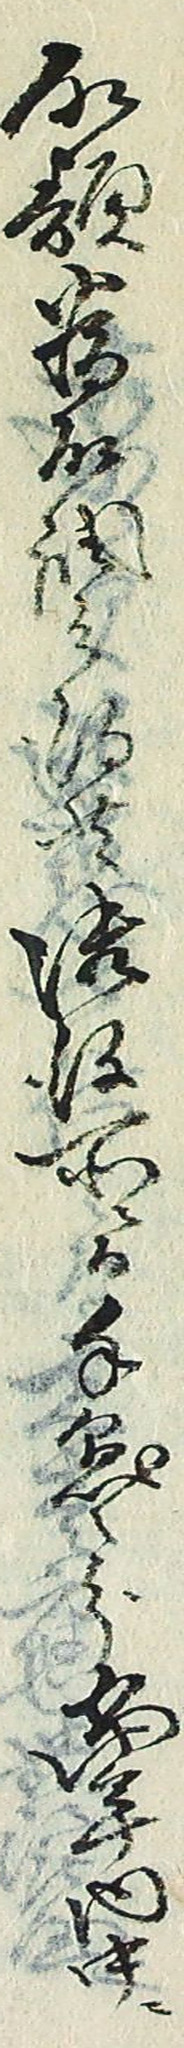取頻為取調候得共御役所ニ而手懸之分當年内中ニ
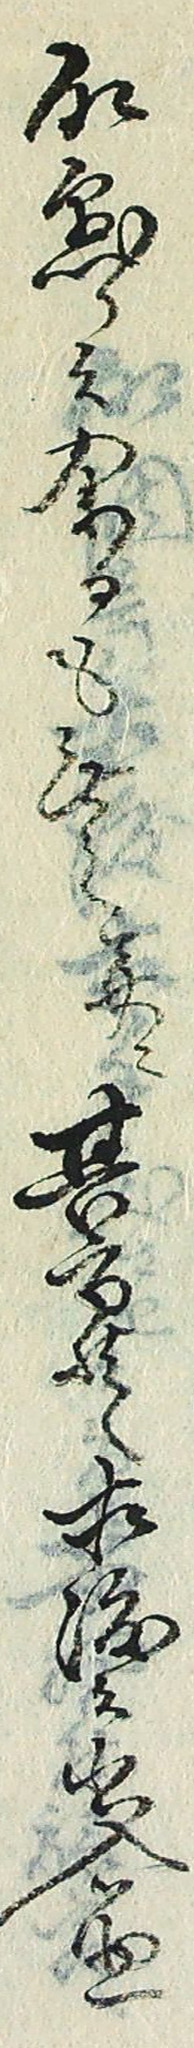取懸り候余日も無之幷ニ其方共へ相渡候出入筋
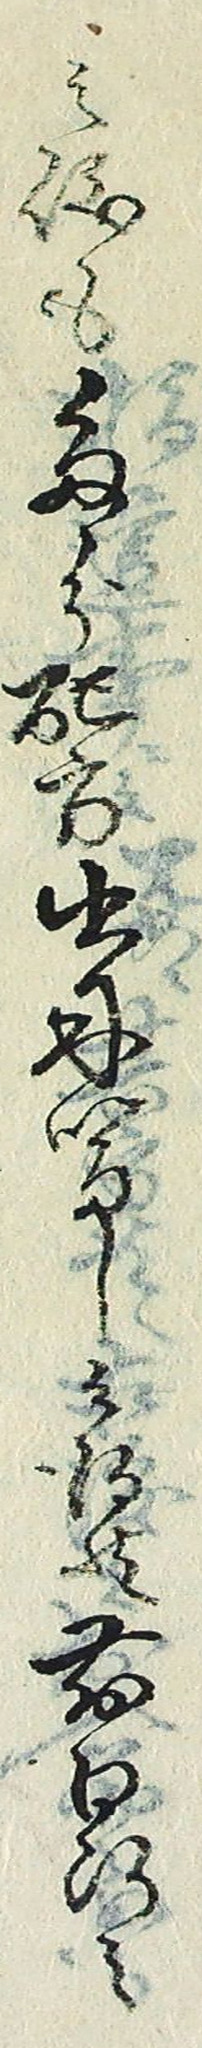之儀も多分配方出来いたし候得共前同断之
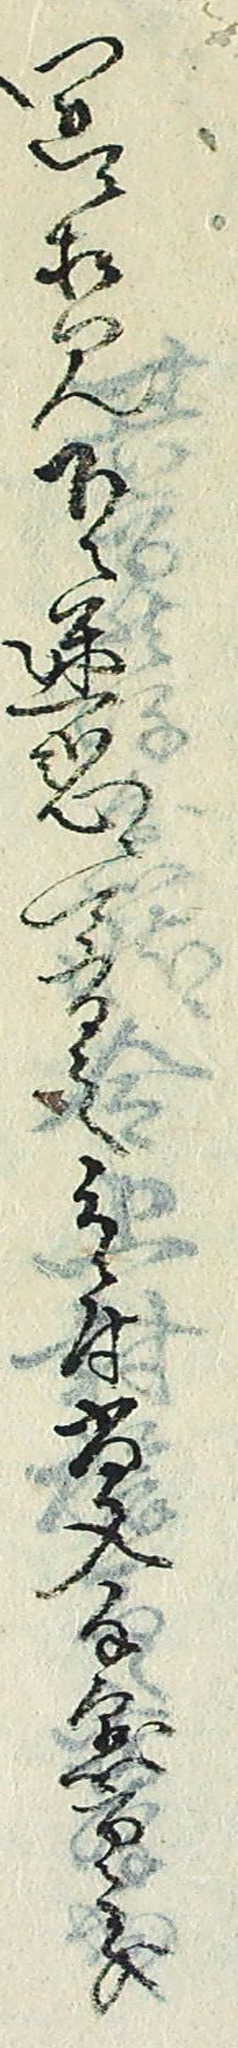運ニ相見下々迷惑ニ可有之候ニ付尚又手懸方之義
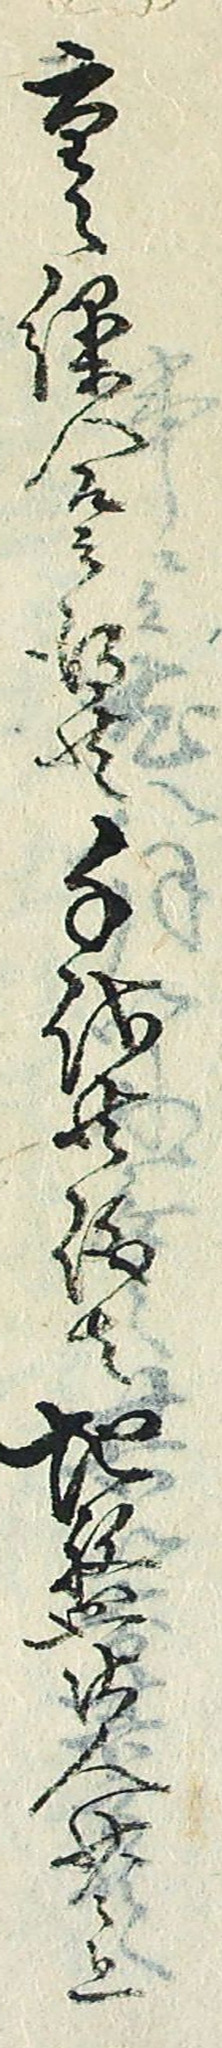重々繰合候得共手代共儀者地盤御人少之上
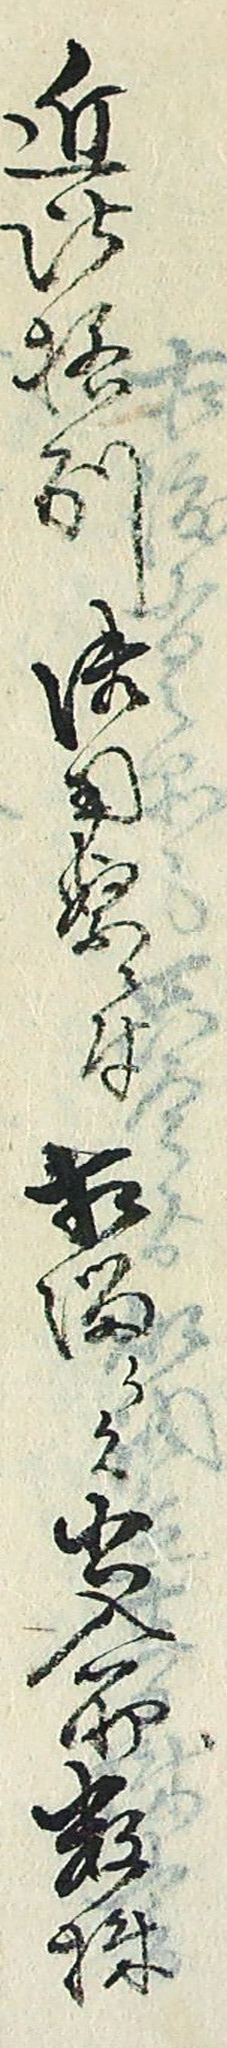近比格別御用繁ニ付相溜り候出入筋数株
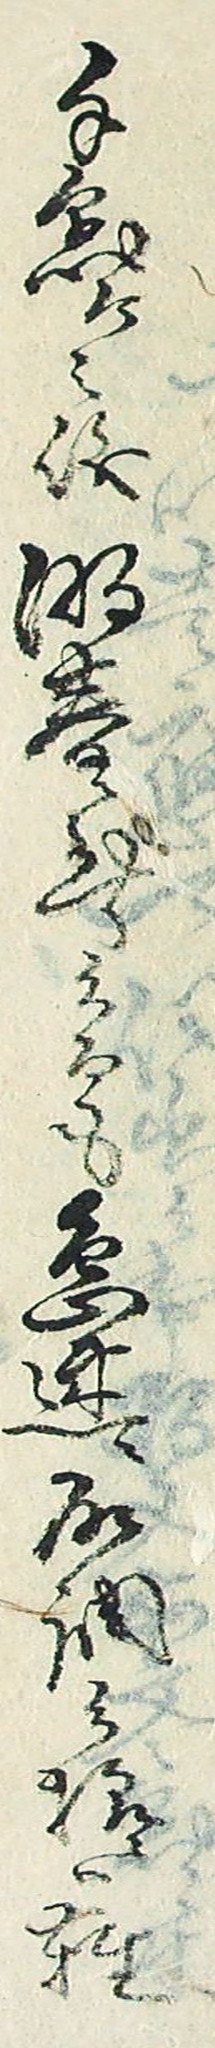手懸ケ之儀明春ニ至り候而も急速ニ取調候様ニハ難

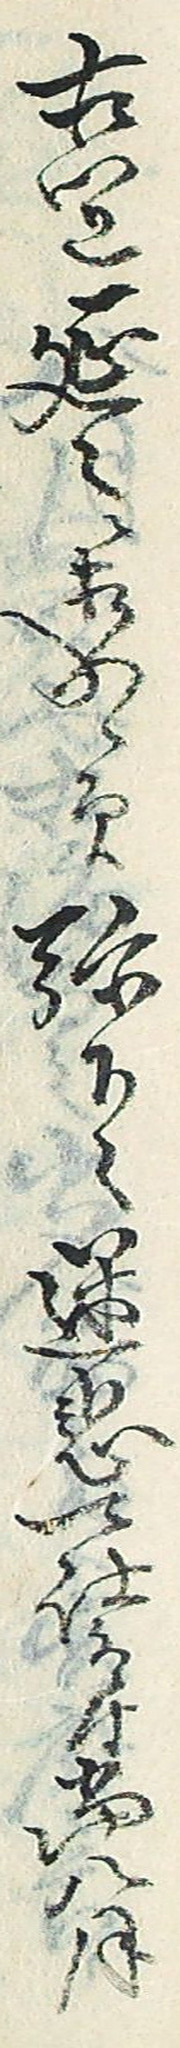相運延々ニ相成候而ハ弥下々迷惑可仕候ニ付當八月
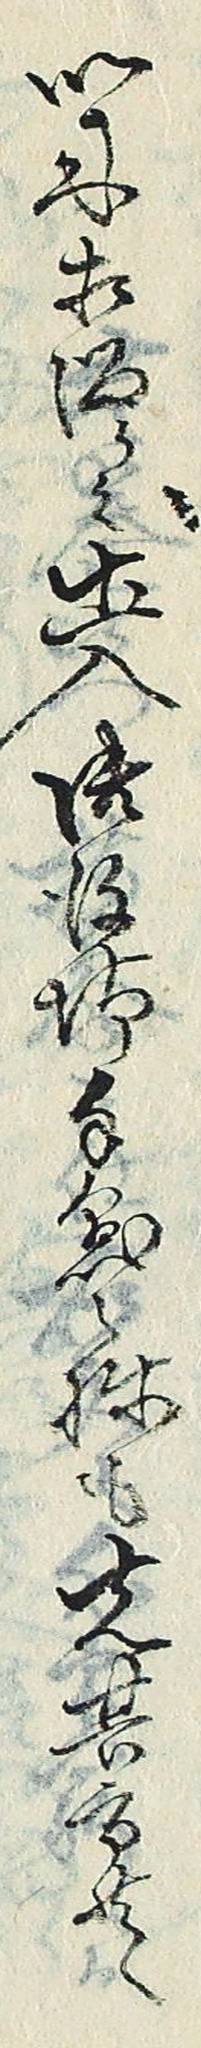以来相溜り候出入御役場手懸之株も先其方共へ
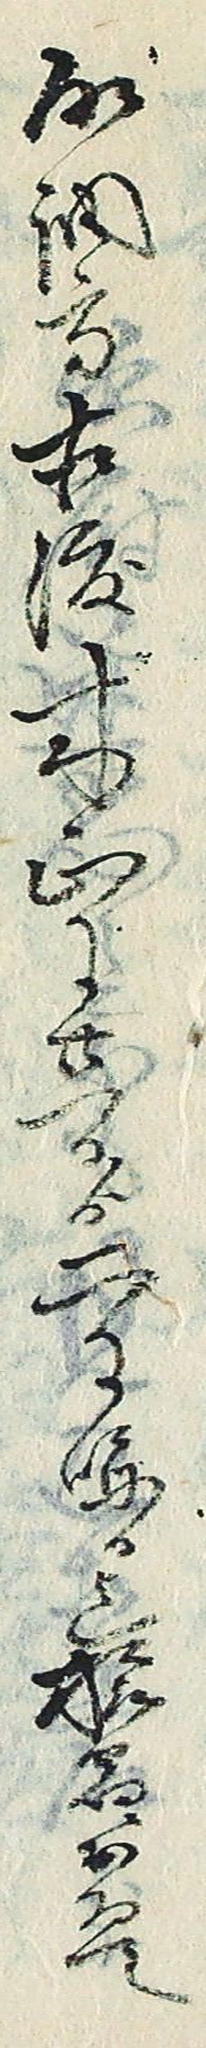取調方相渡来正月廿一日ゟ二月晦日迄旅宿ニおゐて
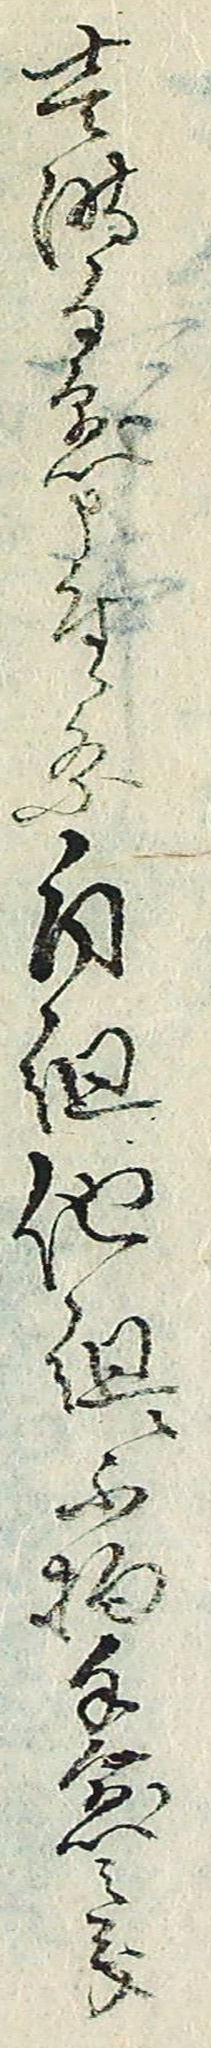壱時手懸申付候条自組他組ニ不拘手懸之義
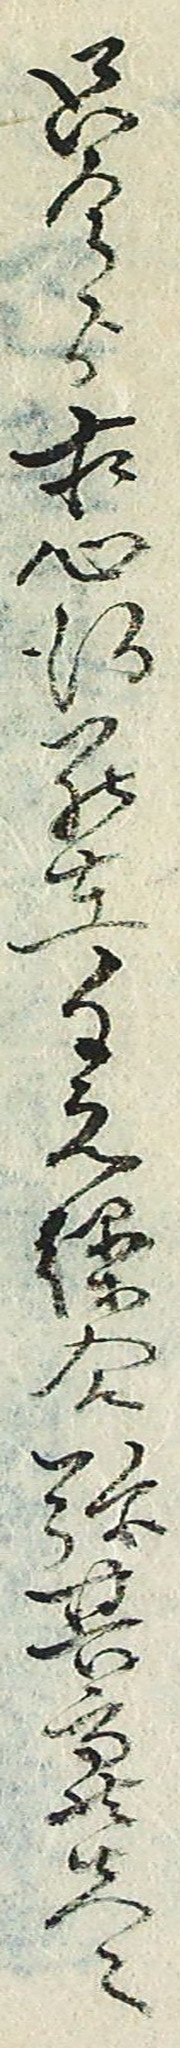只今ゟ相心得罷在手元繰合弥其方共夫々
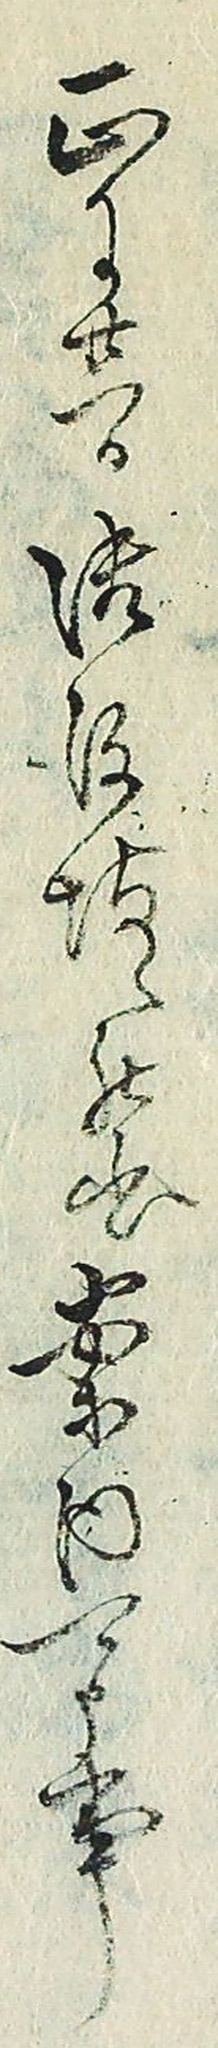正月廿一日御役場へ罷出案内可申事
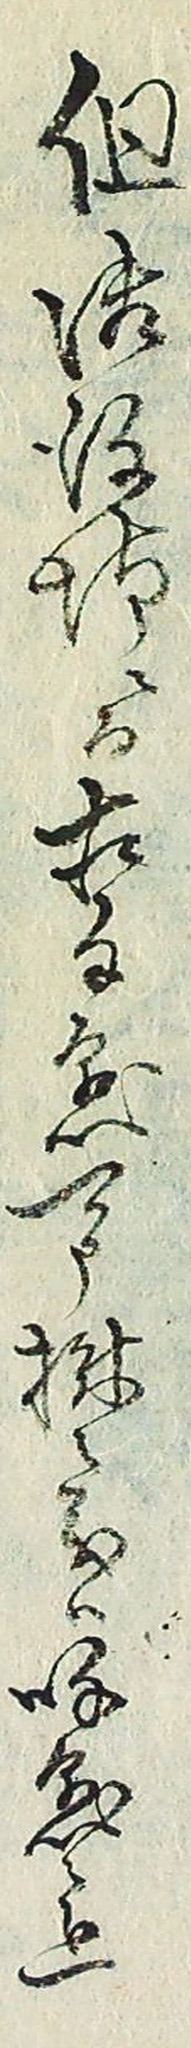但御役場ニ而相手懸可申株之義ハ呼懸之上
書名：諸御趣意書并御下知向之写
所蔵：鳴門教育大学 Naruto University of Education
